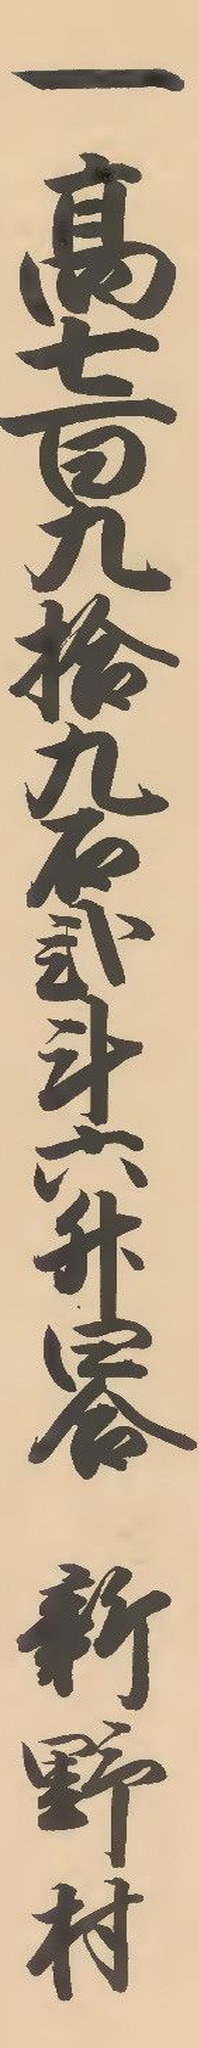一髙七百九拾九石弐斗六升四合新野村
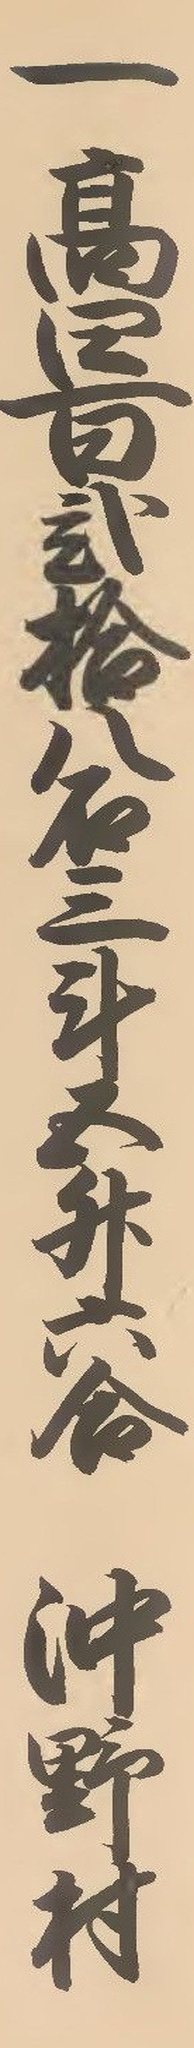一髙四百弐拾八石三斗五升六合沖野村
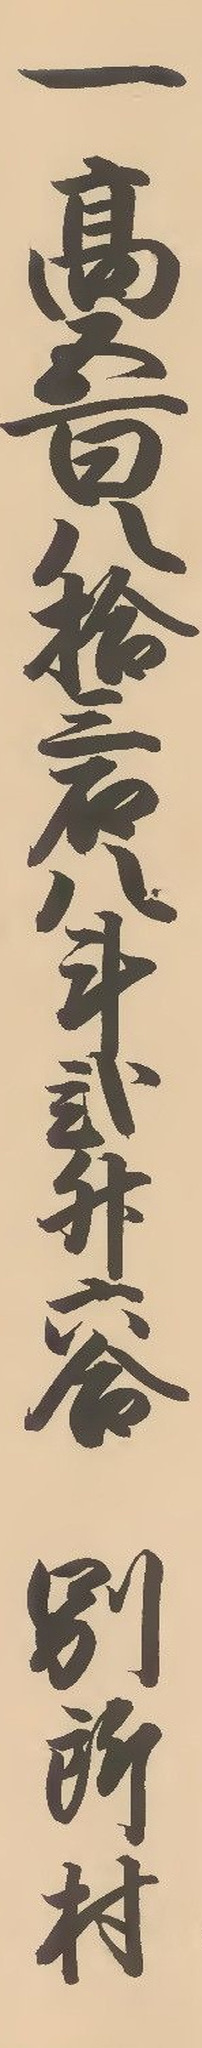一髙五百八拾三石八斗弐升六合別所村
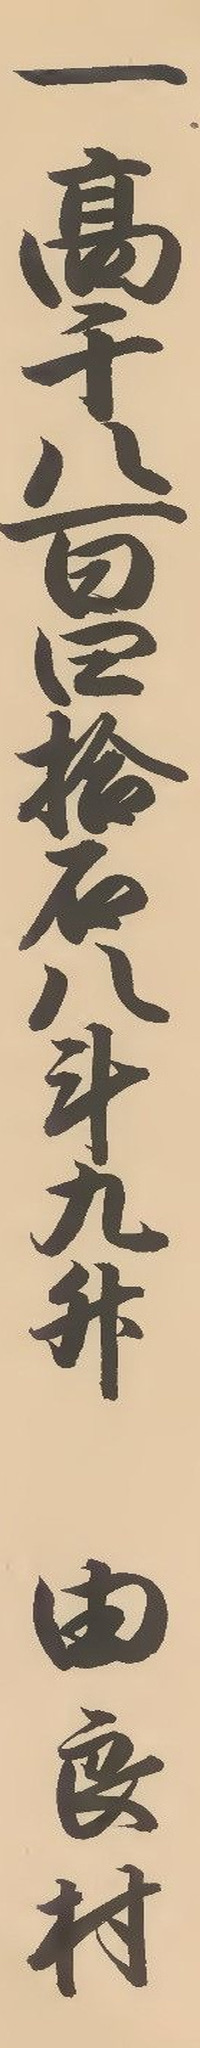一髙千八百四拾石八斗九升由良村
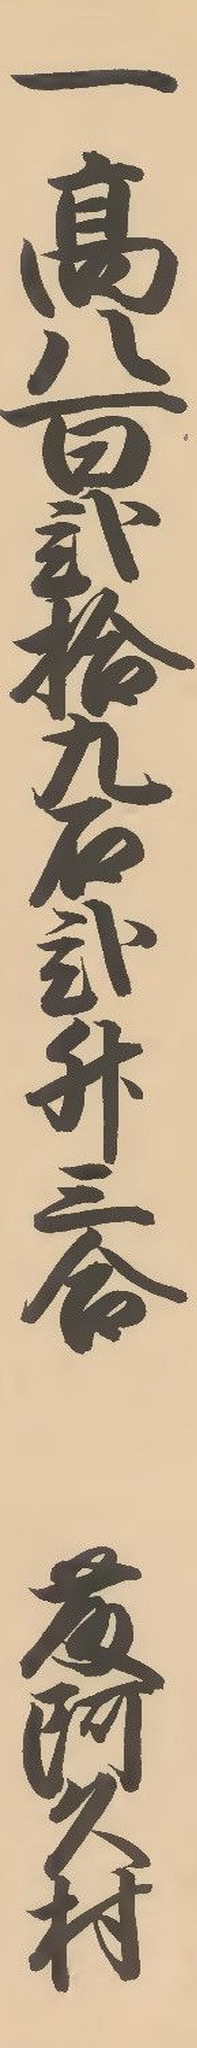一髙八百弐拾九石弐升三合藤阿久村

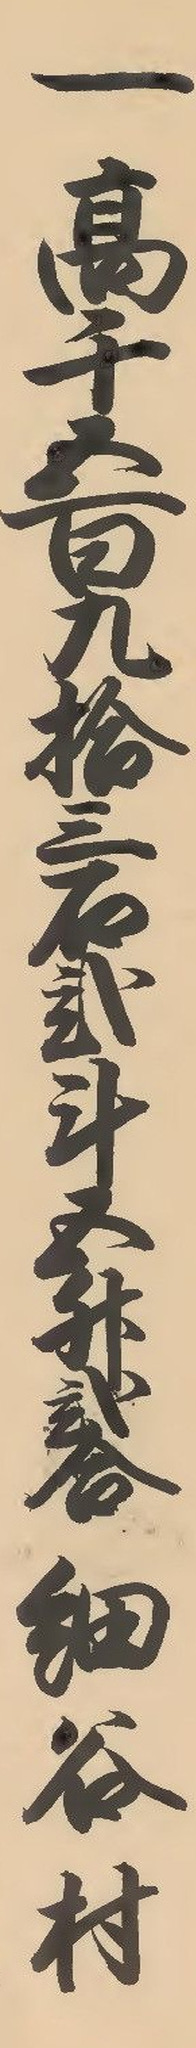一髙千五百九拾三石弐斗五升弐合細谷村
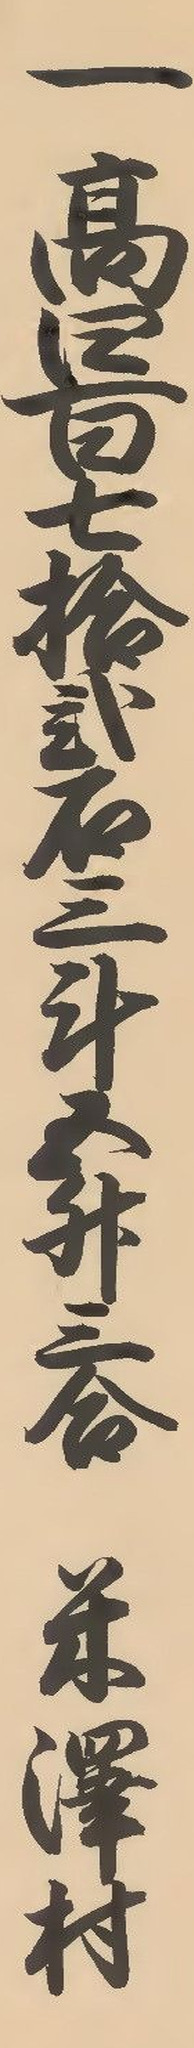一髙四百七拾弐石三斗五升三合米澤村
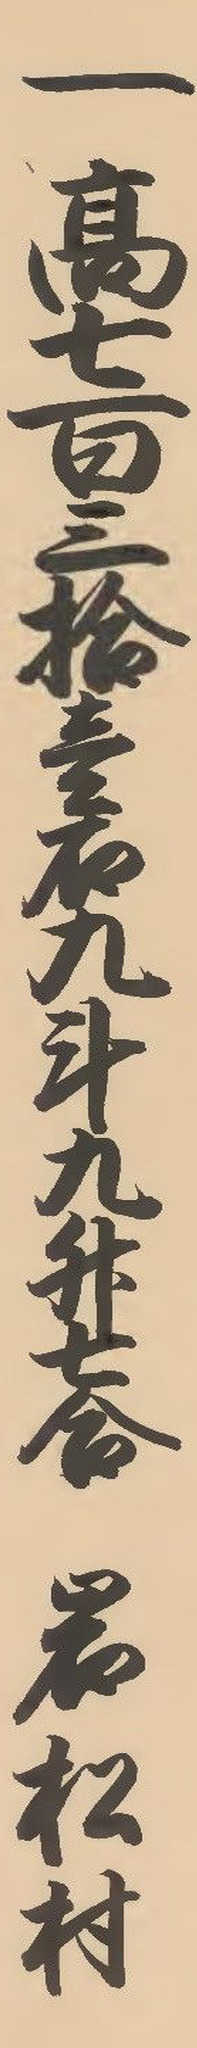一髙七百三拾壱石九斗九升七合岩松村
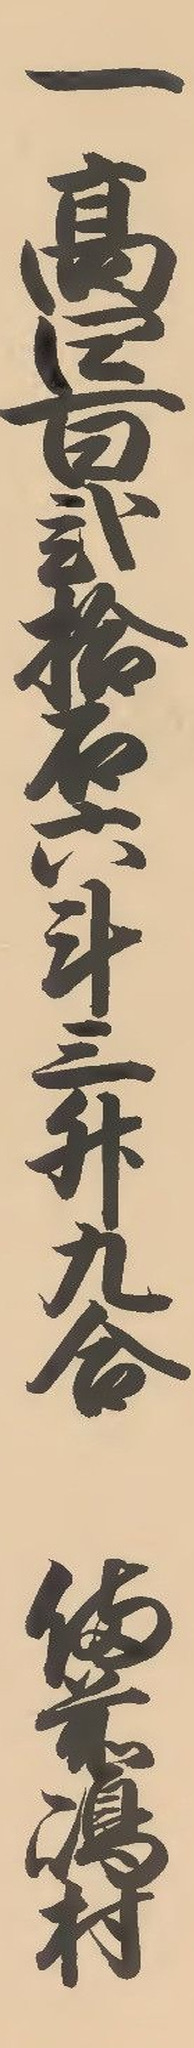一髙四百弐拾石六斗三升九合備前嶋村
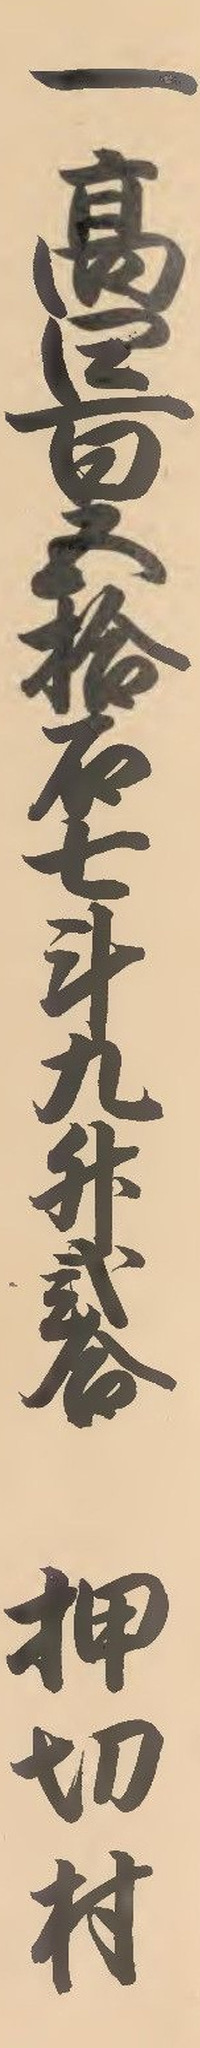一髙四百五拾石七斗九升弐合押切村
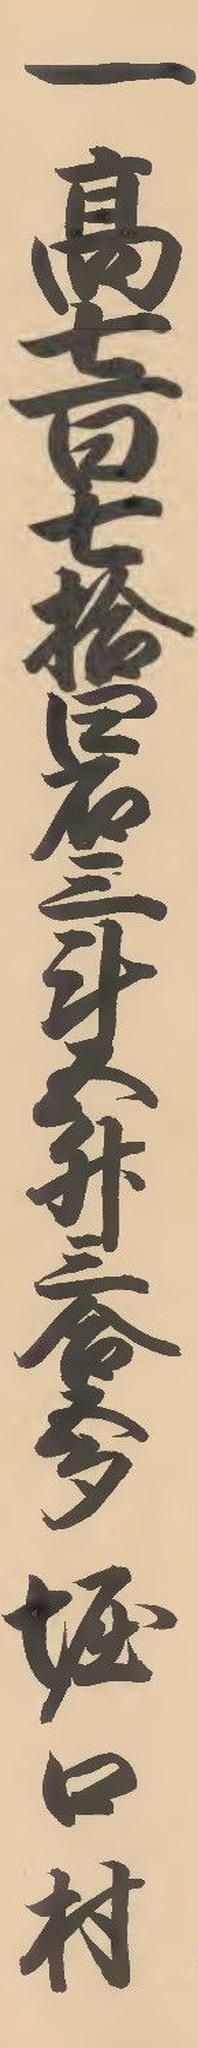一髙七百七拾四石三斗五升三合五夕堀口村
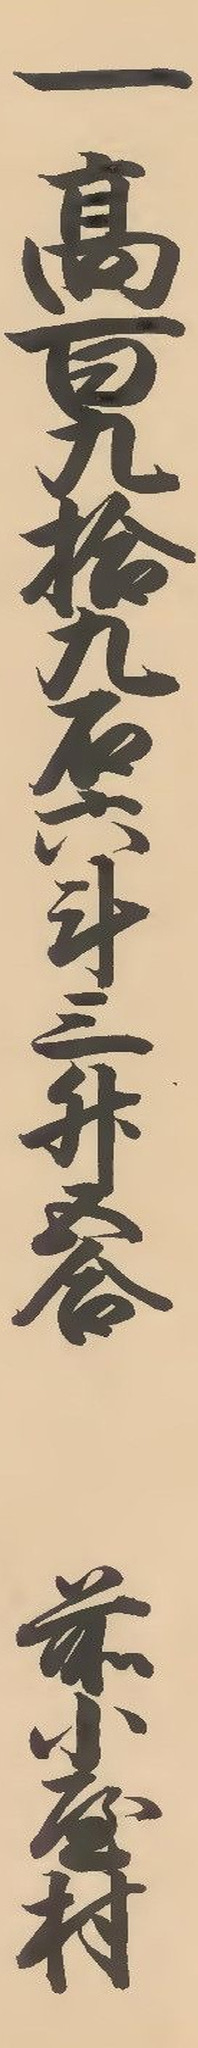一髙百九拾九石六斗三升五合前小屋村
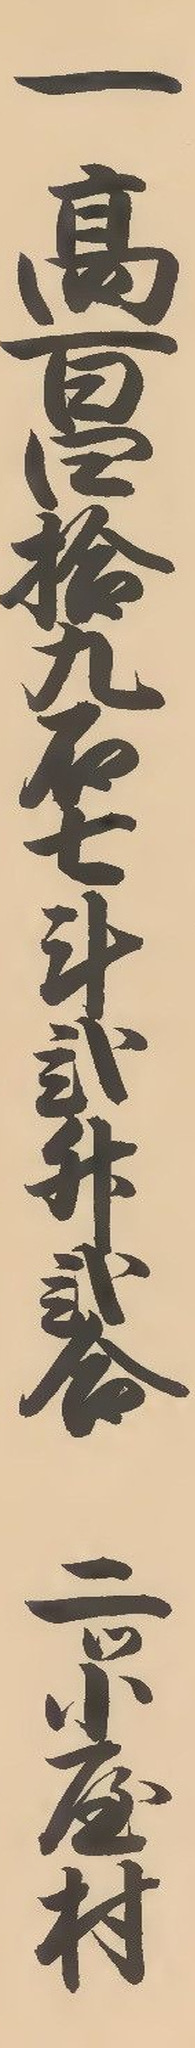一髙百四拾九石七斗弐升弐合二ツ小屋村

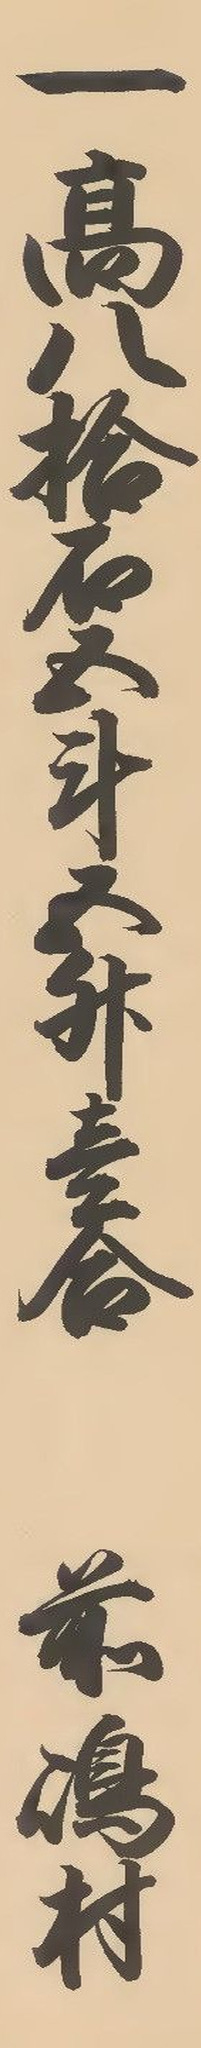一髙八拾石五斗五升壱合前嶋村
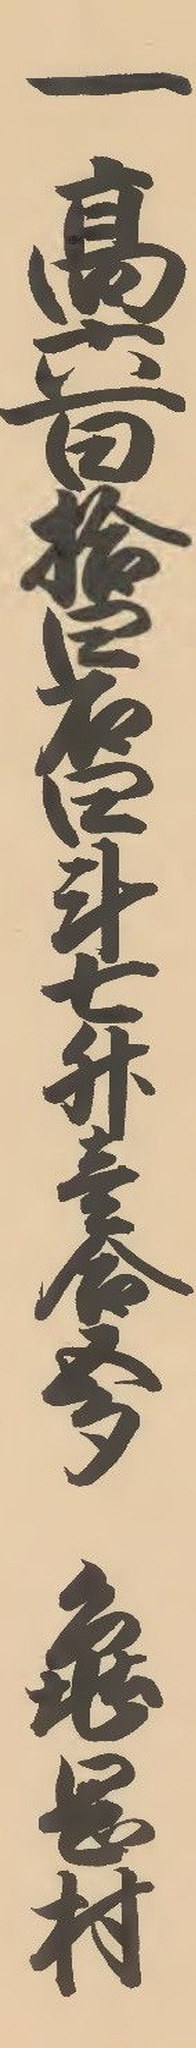一髙六百拾四石四斗七升壱合五夕龜岡村
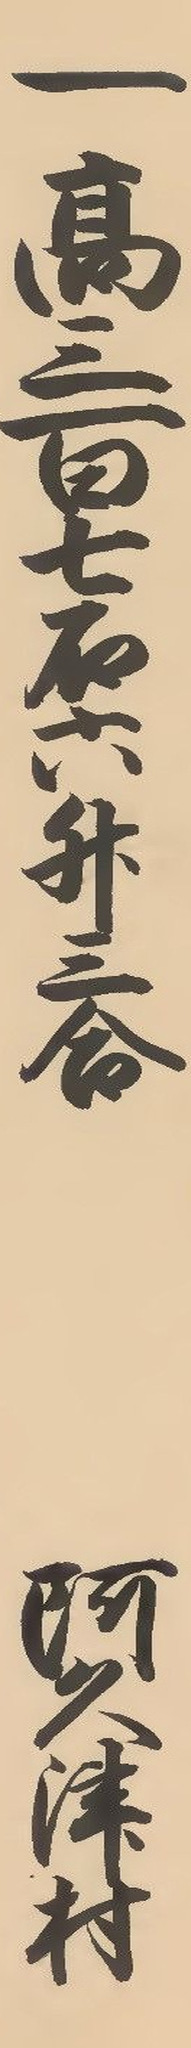一髙三百七石六升三合阿久津村
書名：上野国郷帳
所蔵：国立公文書館 National Archives of Japan
